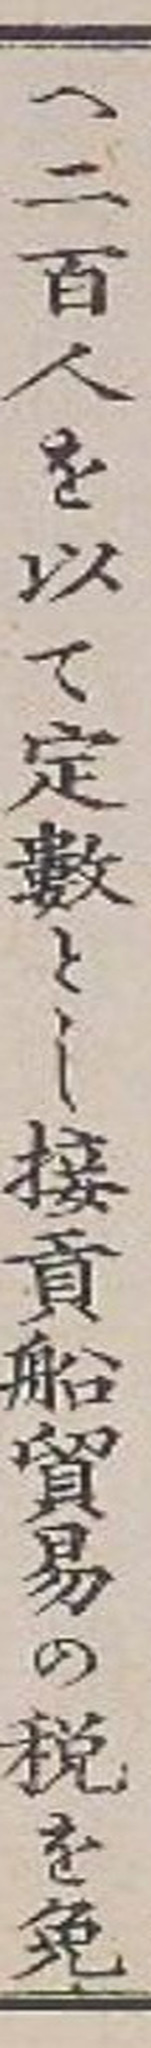へ二百人を以て定数とし接貢船貿易の税を免
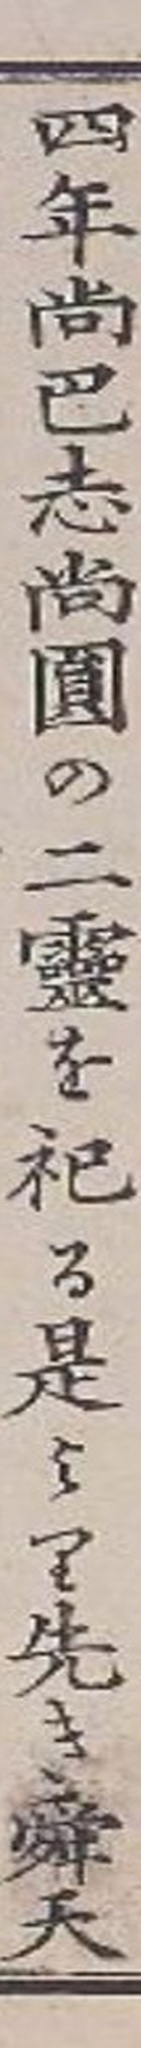四年尚巴志尚円の二霊を祀る是より先き舜天
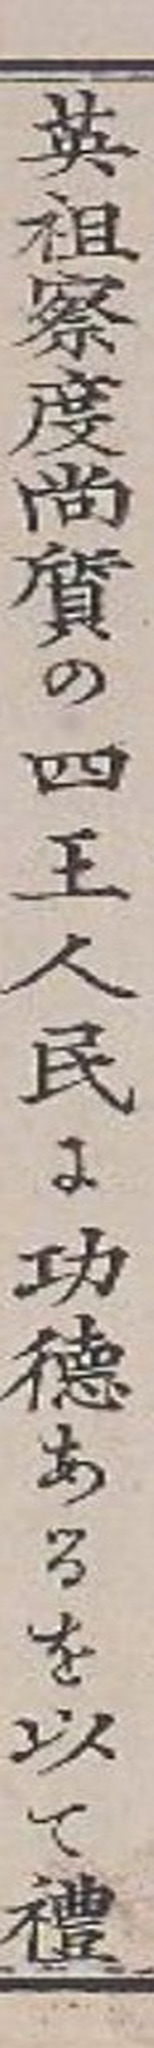英祖察度尚質の四王人民に功徳あるを以て礼
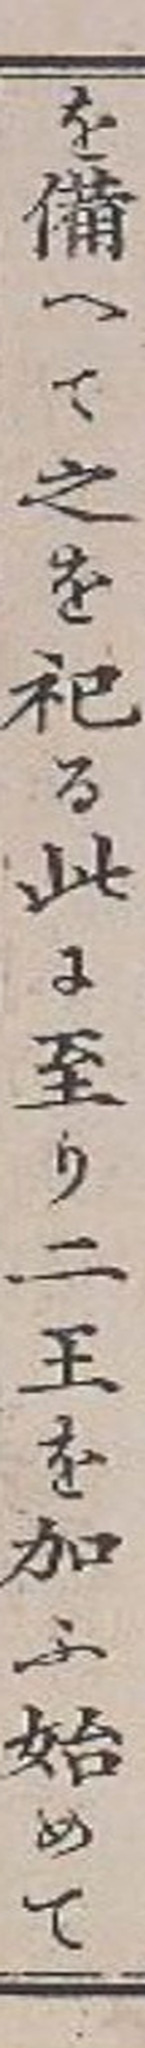を備へて之を祀る此に至り二王を加ふ始めて

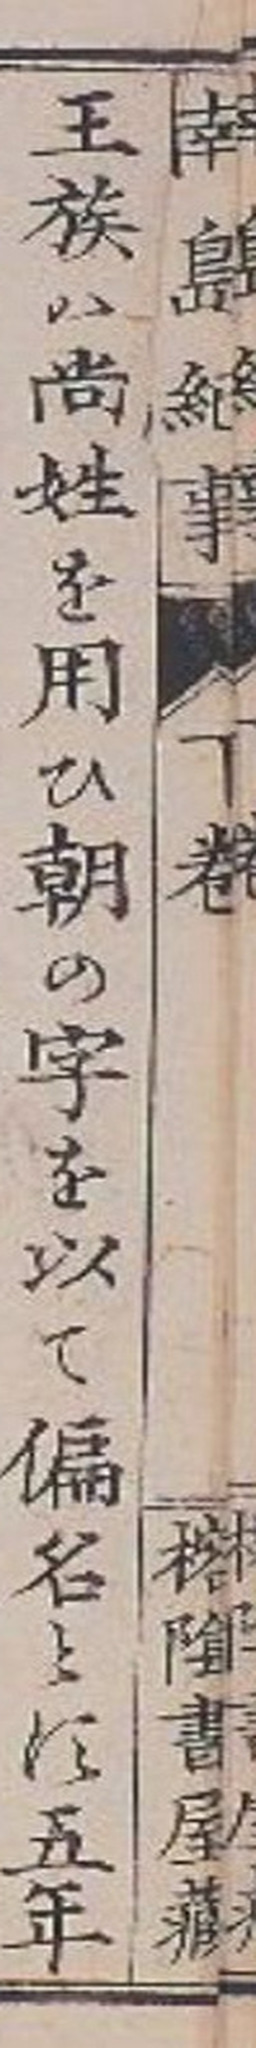王族は尚姓を用ひ朝の字を以て偏名とす五年
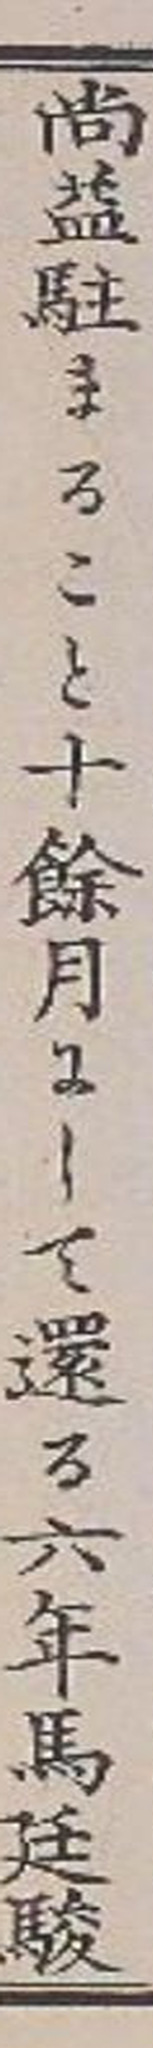尚益駐まること十余月にして還る六年馬廷駿
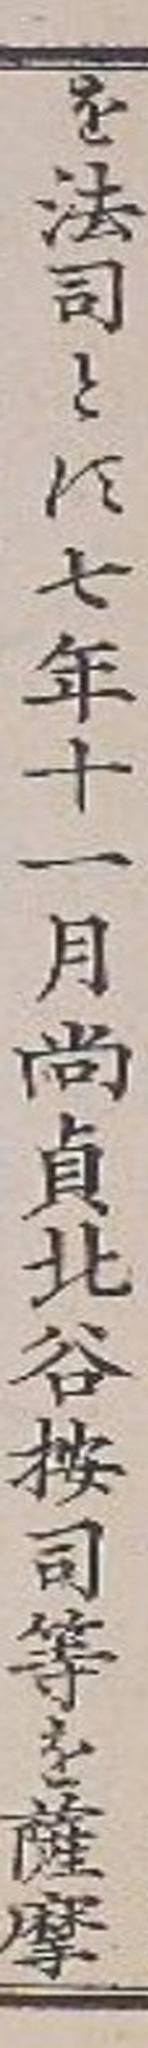を法司とす七年十一月尚貞北谷按司等を薩摩
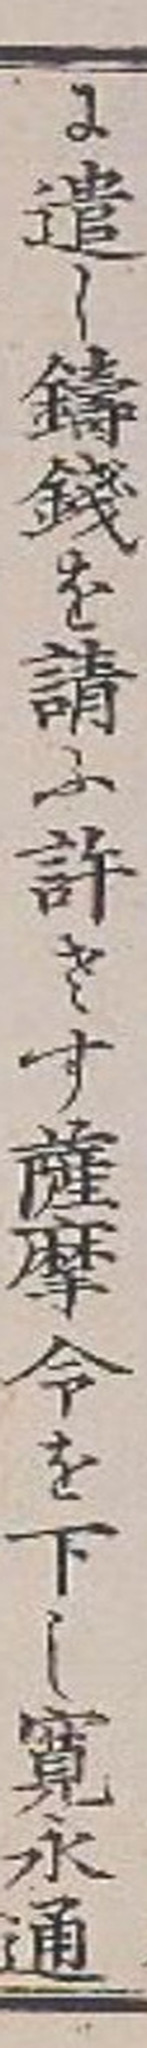に遣し鋳銭を請ふ許さす薩摩令を下し寛永通
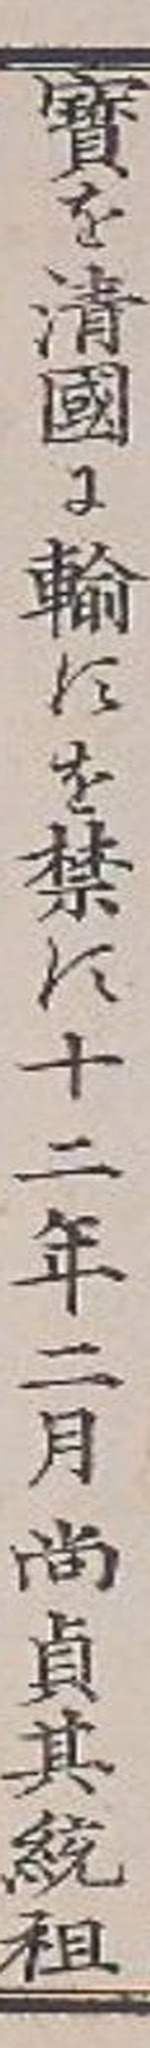宝を清国に輸すを禁す十二年二月尚貞其統祖
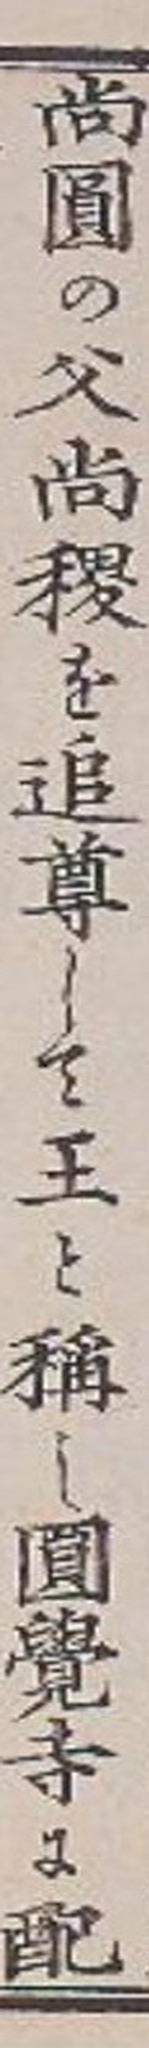尚円の父尚稷を追尊して王と称し円覚寺に配
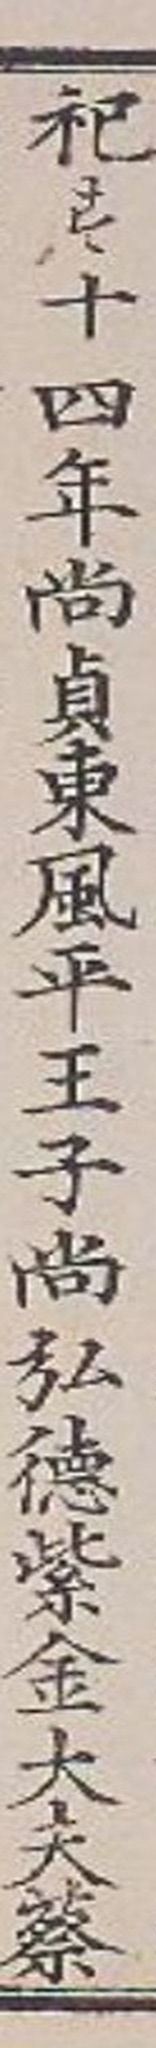祀す十四年尚貞東風平王子尚弘徳紫金大夫蔡
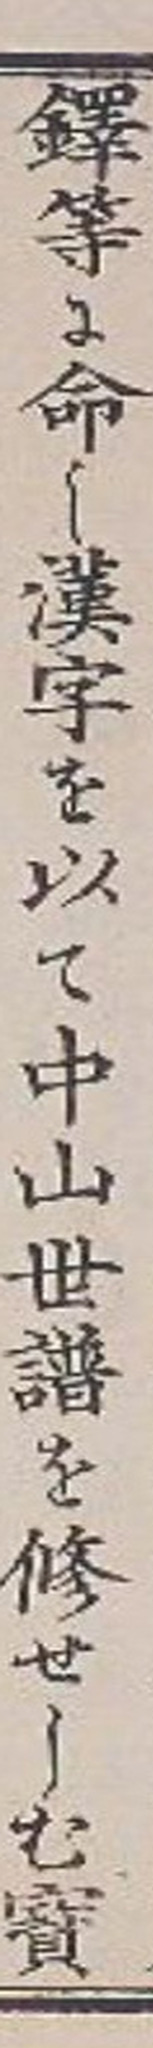鐸等に命し漢字を以て中山世譜を修せしむ宝
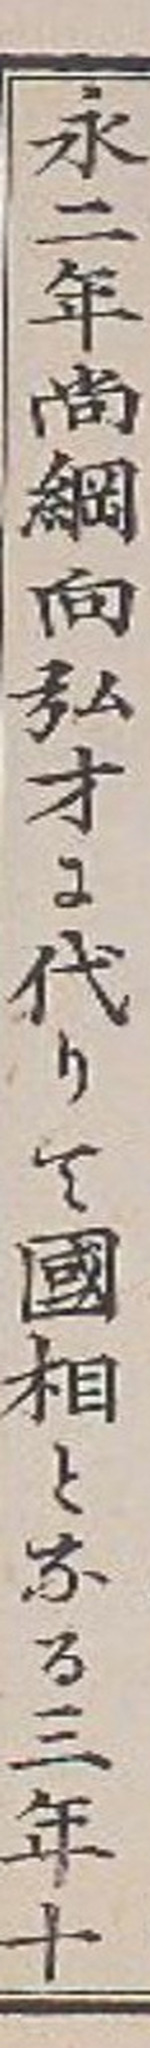永二年尚綱尚弘才に代りて国相となる三年十
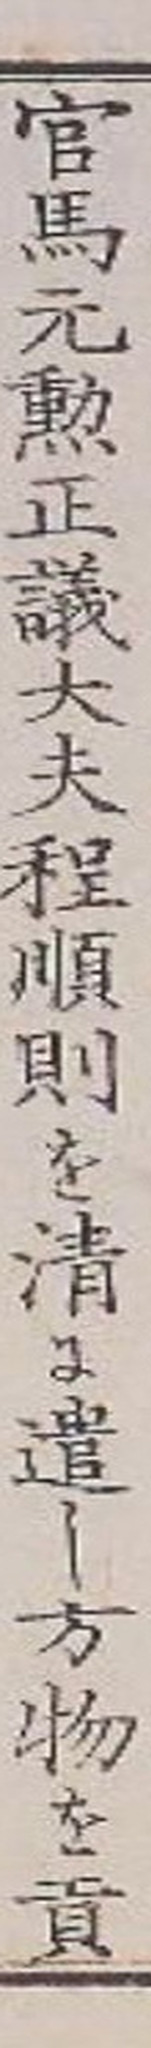官馬元勲正議大夫程順則を清に遣し方物を貢
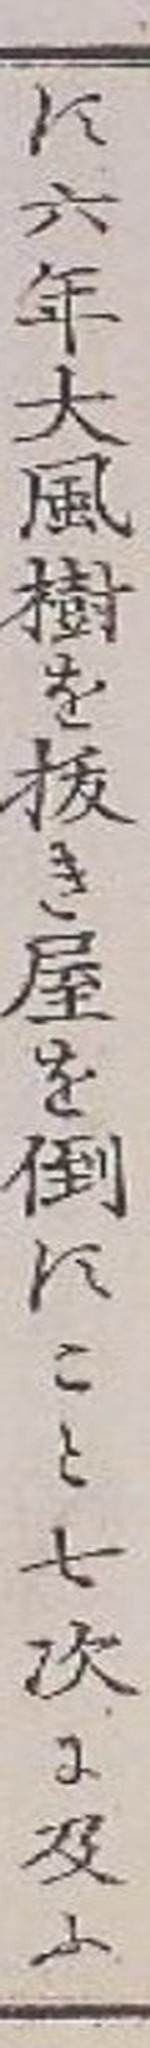す六年大風樹を抜き屋を倒すこと七次に及ふ
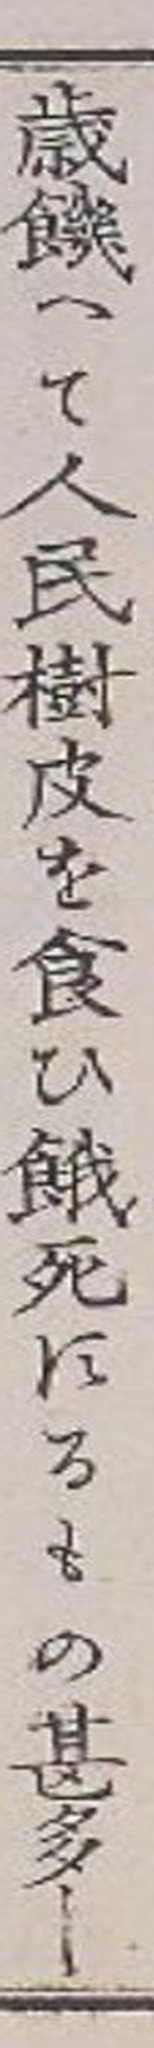歳飢へて人民樹皮を食ひ餓死するもの甚多し
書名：南島紀事 下
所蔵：University of the Ryukyus Library
